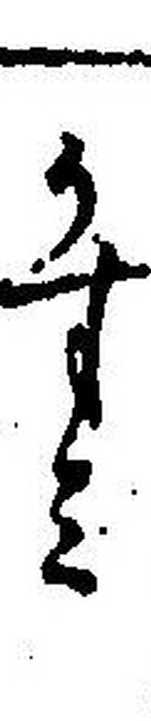かすみ
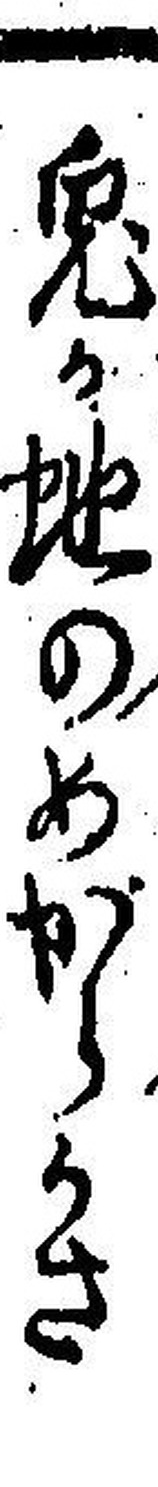鬼か蛇のめからかさ
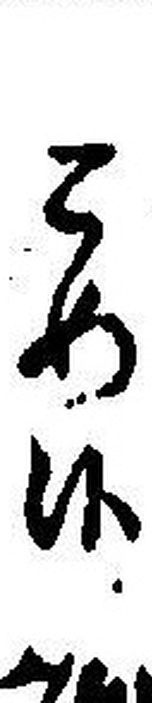こめ候
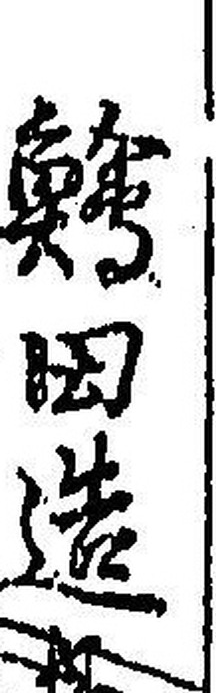鱠田造
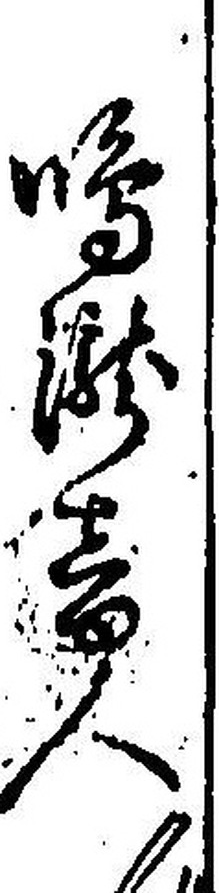鳴滝音人
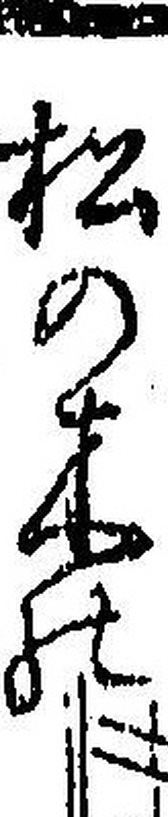松の木の
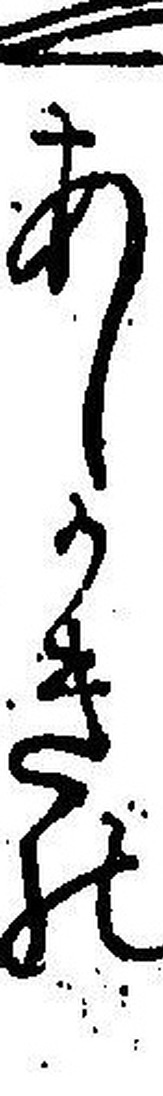あしかきの
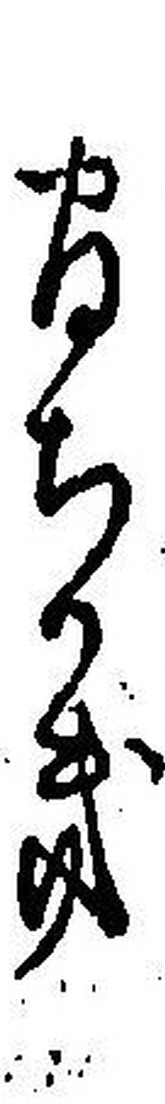間ちかき
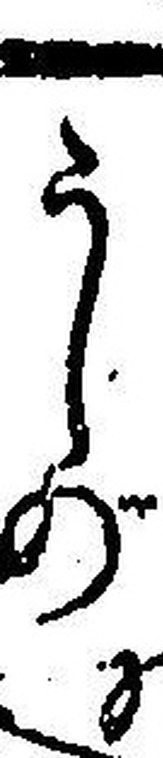うしの
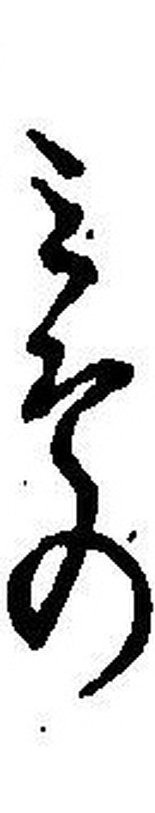みその
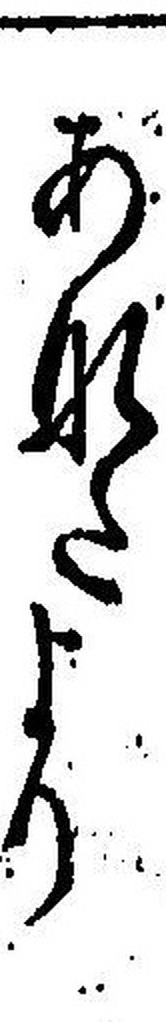あなたより
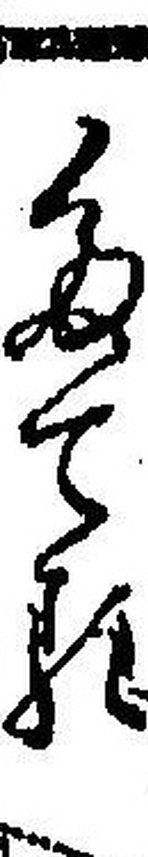たてる
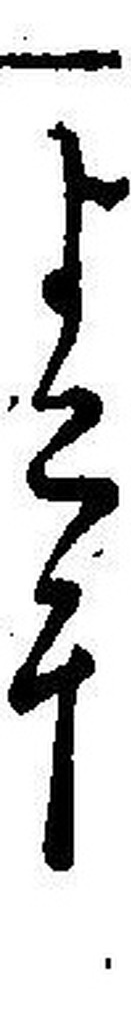よこに
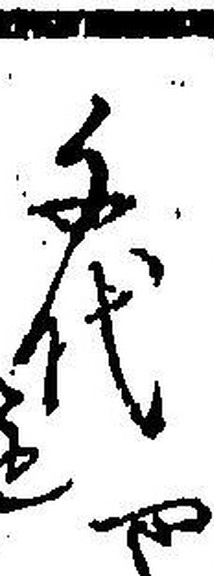千代も
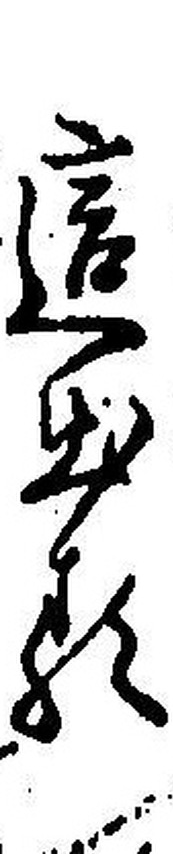這出る
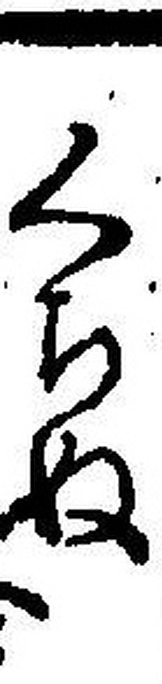くちぬ
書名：どうれ百人一首 / 鹿都部真顔(狂歌堂)編
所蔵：東京大学総合図書館 General Library in the University of Tokyo, JAPAN
